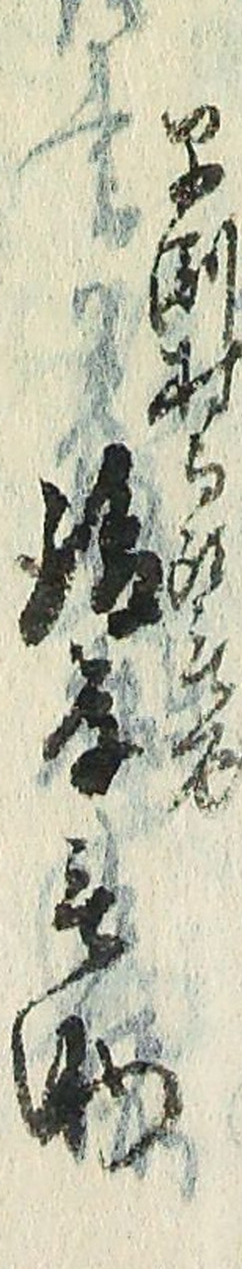後藤庄助
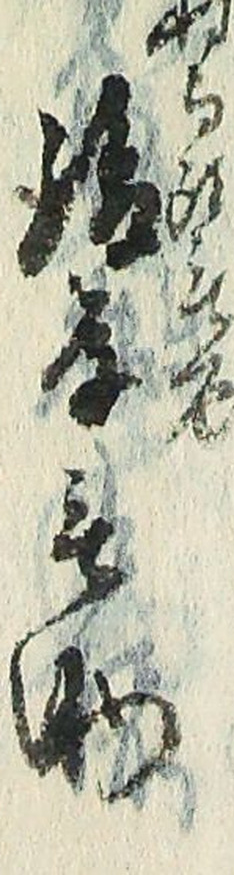後藤庄助
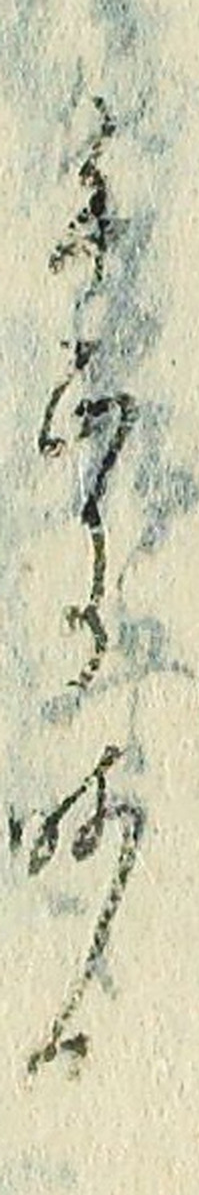午正月晦日
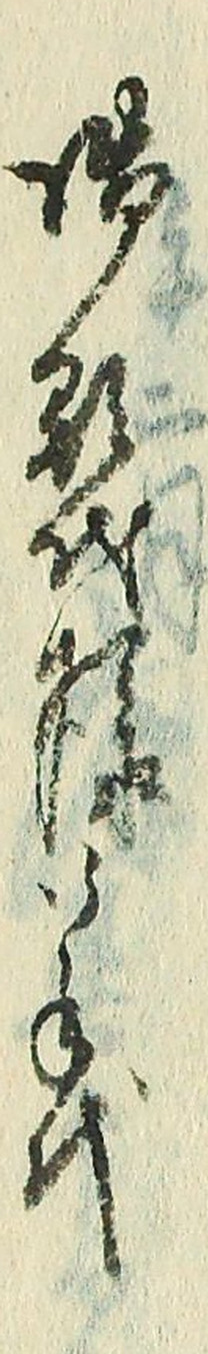御郡代様御手代
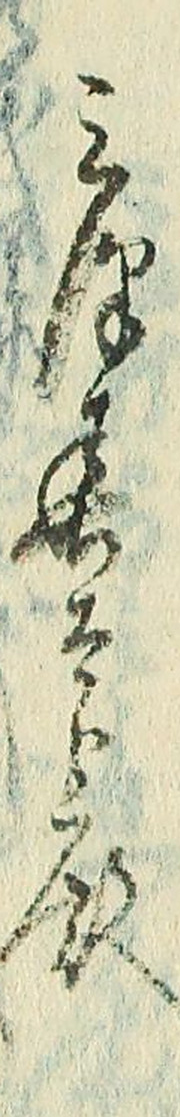三沢春太郎殿
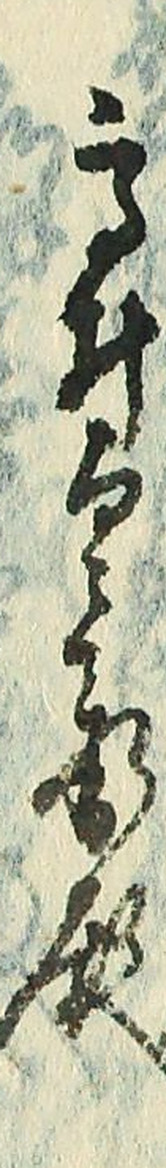高井与三兵衛殿
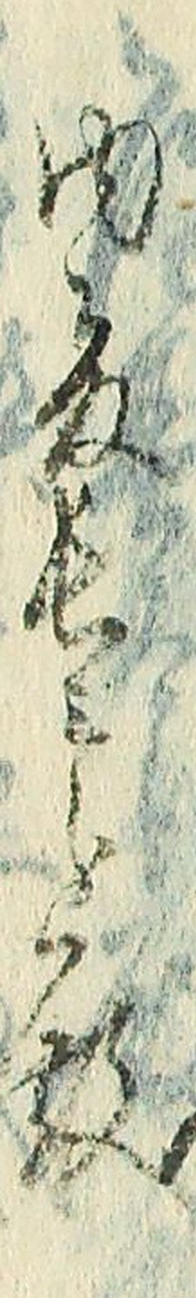内藤長三郎殿
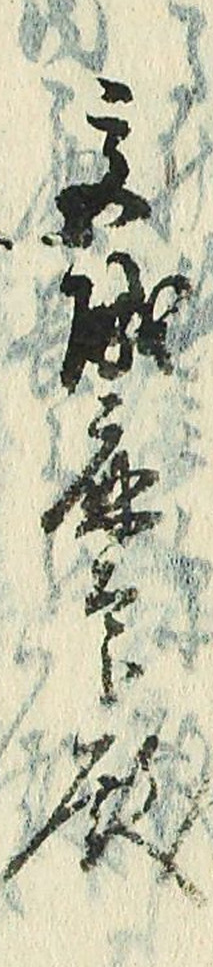宮城麻太郎殿

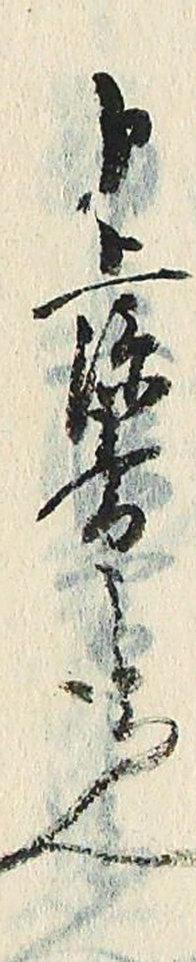申上添書之覚
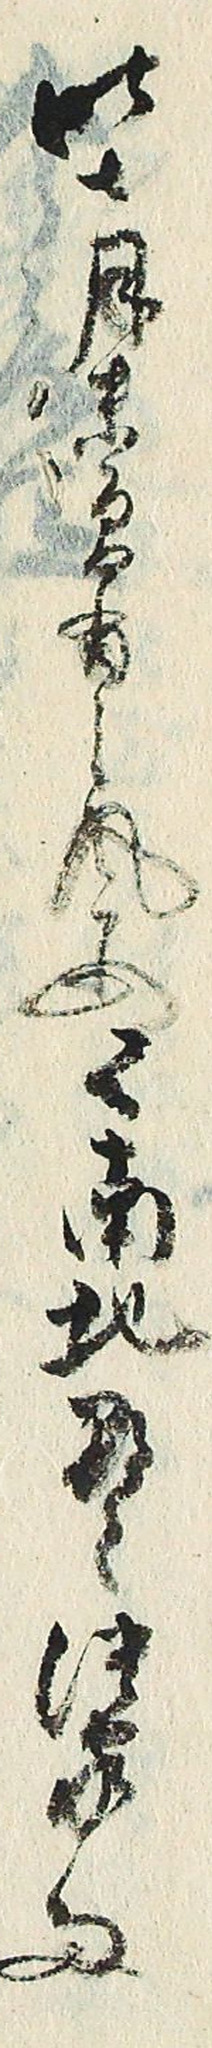昨七月未曽有之風雨に而南北郡々潰家多
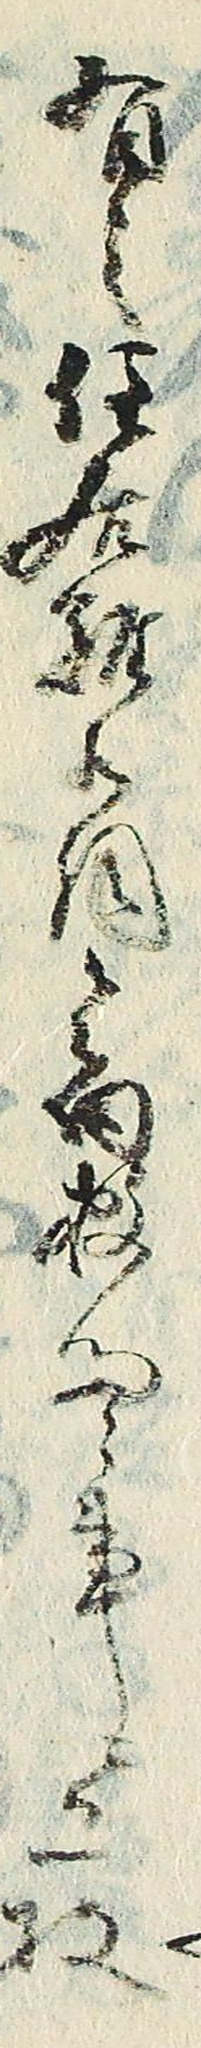有之住居難相調候者数多之事に而一牧
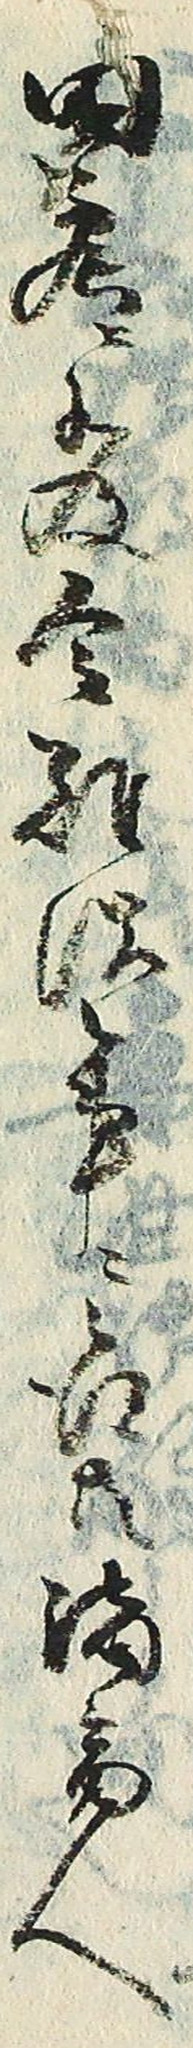困窮に相及全難渋之事に候得共諸商人
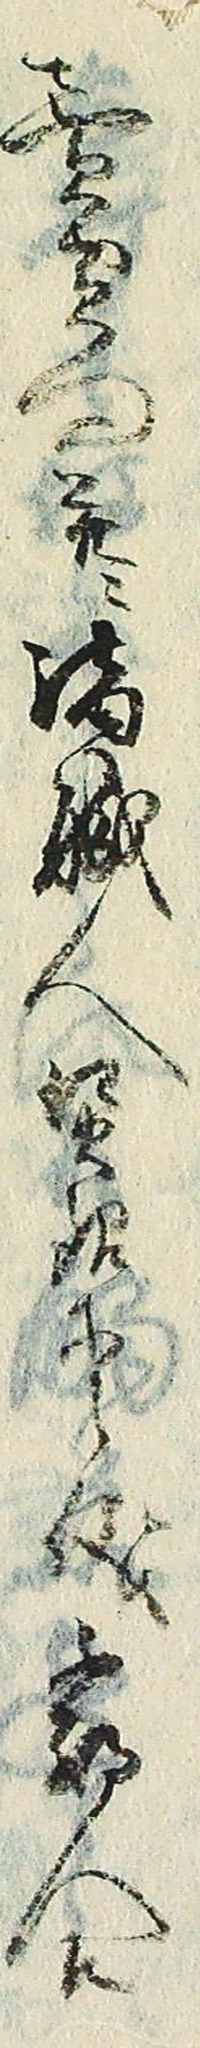売買向幷に諸職人賃金等之儀不都合
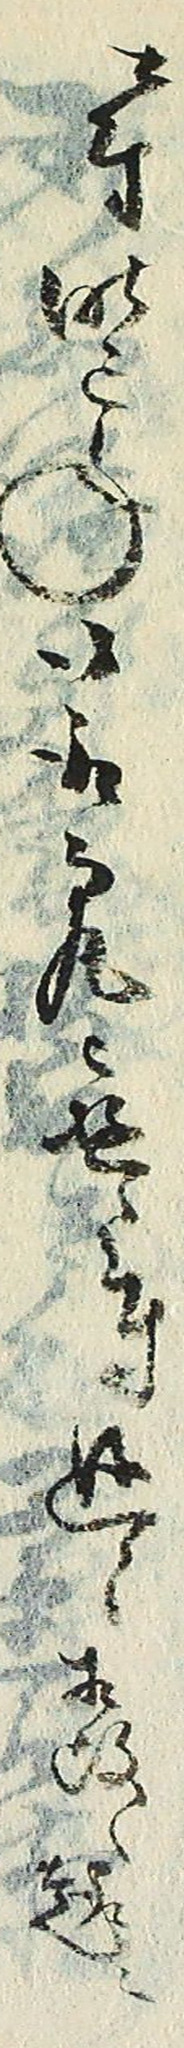に付昨巳年御取究被遊候に付追々相改候趣に
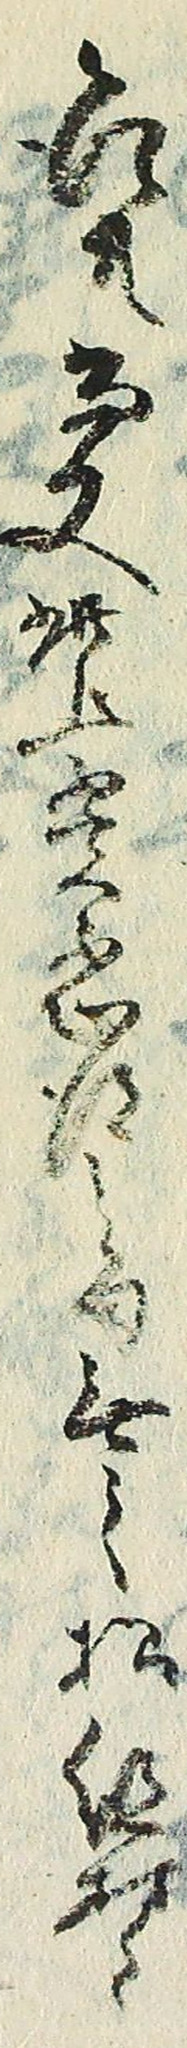候得共尚又此上不実不心得之者無之様組村々
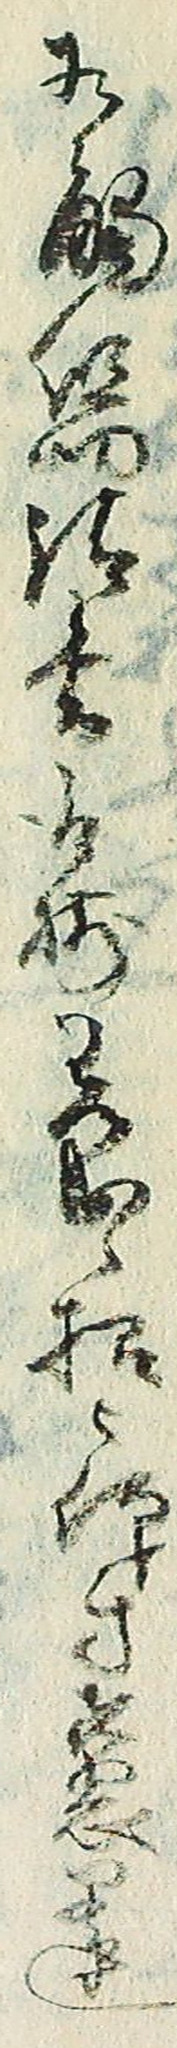相触組切請書取揃差出候様被仰付奉畏早速
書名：諸御用御□受書控
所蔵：鳴門教育大学 Naruto University of Education
